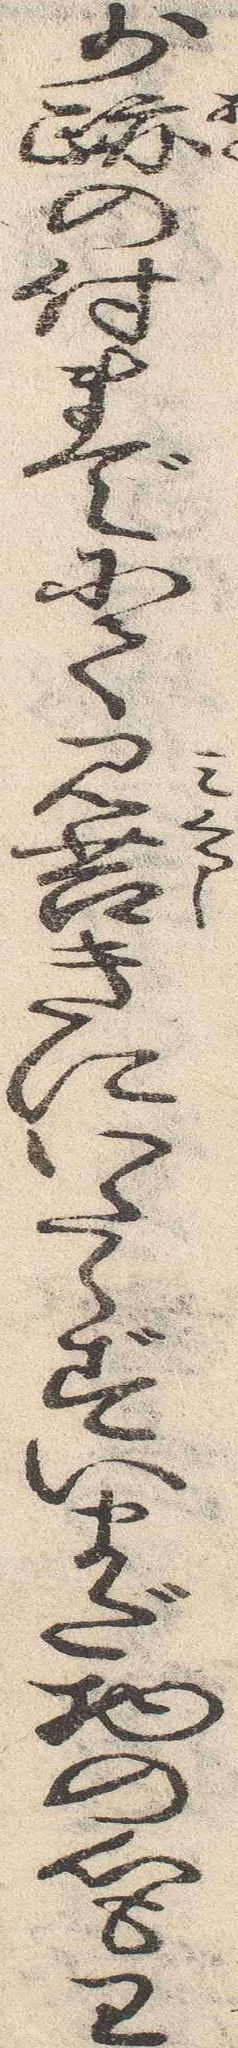少跡の付までにて見苦きにいたらずいまだ物の心もわ
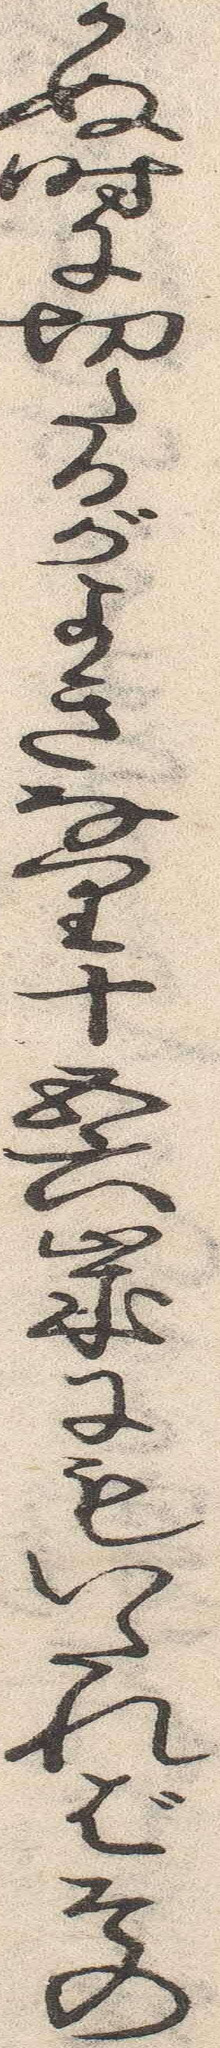かぬ時に切たるがよきなり十五六歳にもいたればその
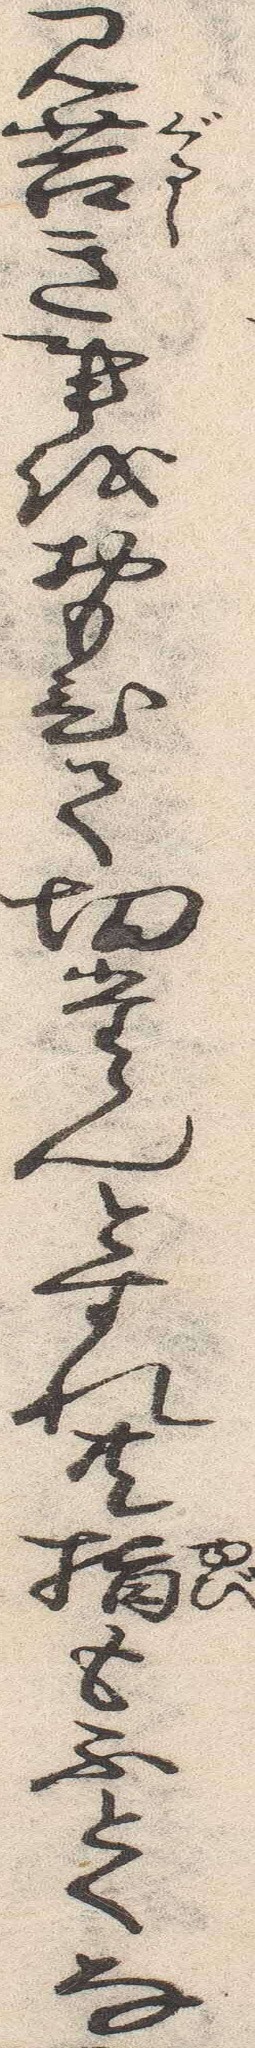見苦き事をおもひて切とらんとすれ共指もふとくな
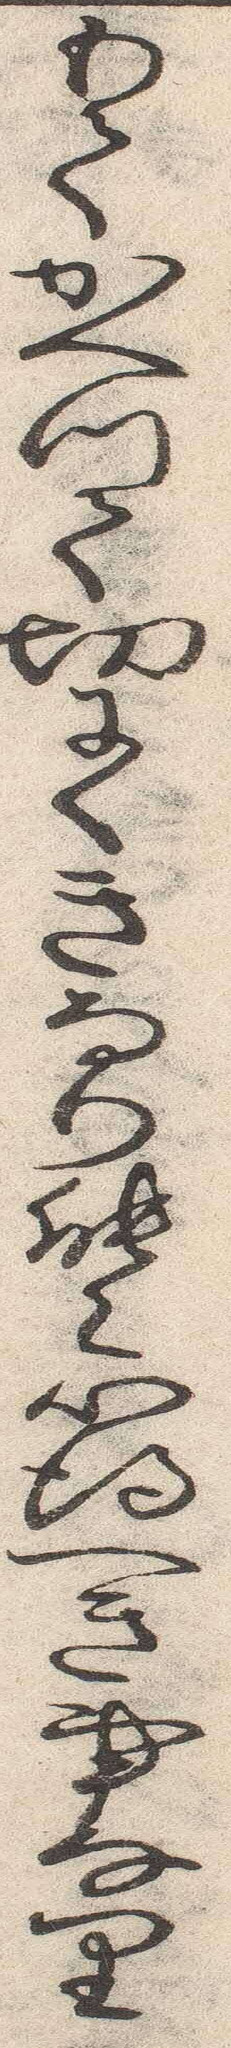りてかへつて切にくきなり能〻心得へき事なり
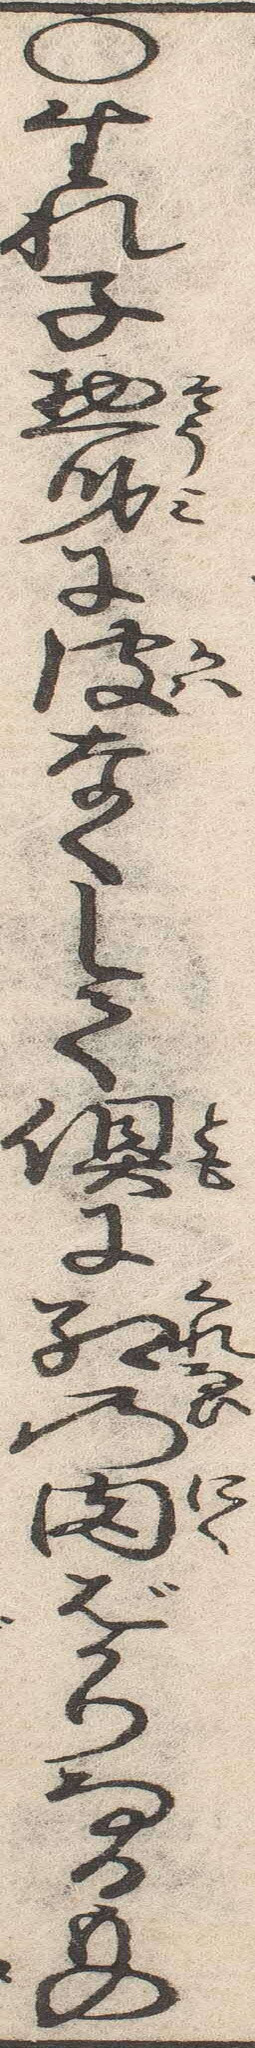◯生れ子惣身に皮なくして倶に紅の肉ばかりなるもの
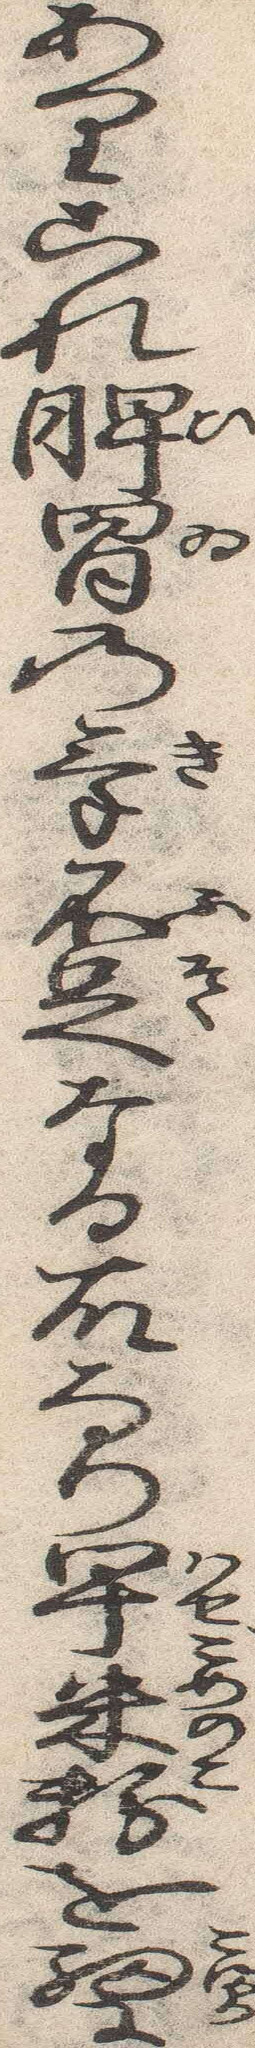ありこれ脾胃の氣不足なる故なり早米粉を細に
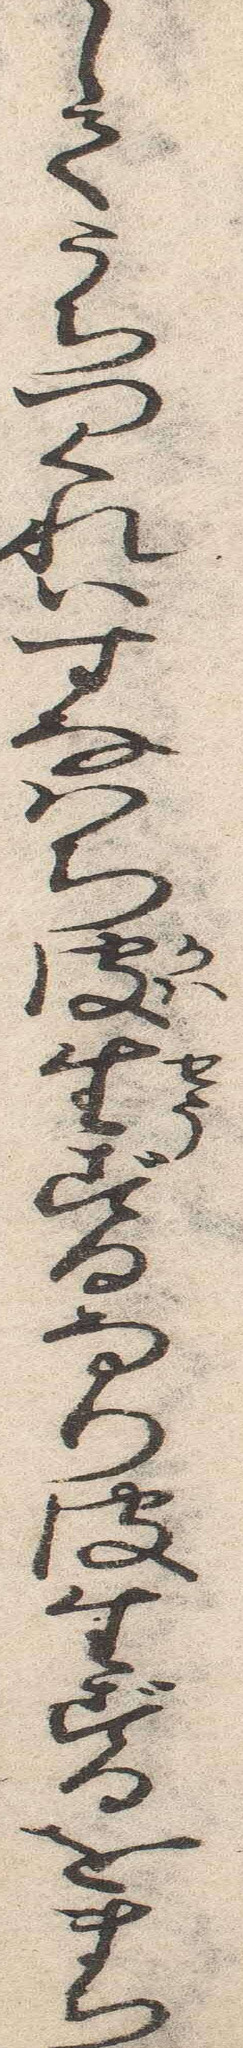してうちつくれはすなはち皮生ずるなり皮生ずるをまち
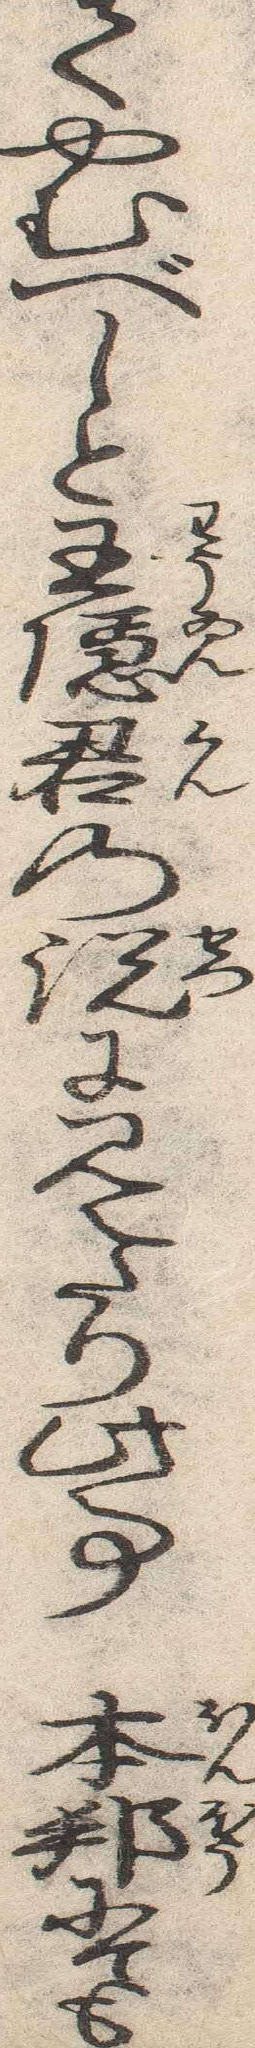てやむべしと王隠君の説に見えたり此事本邦にても
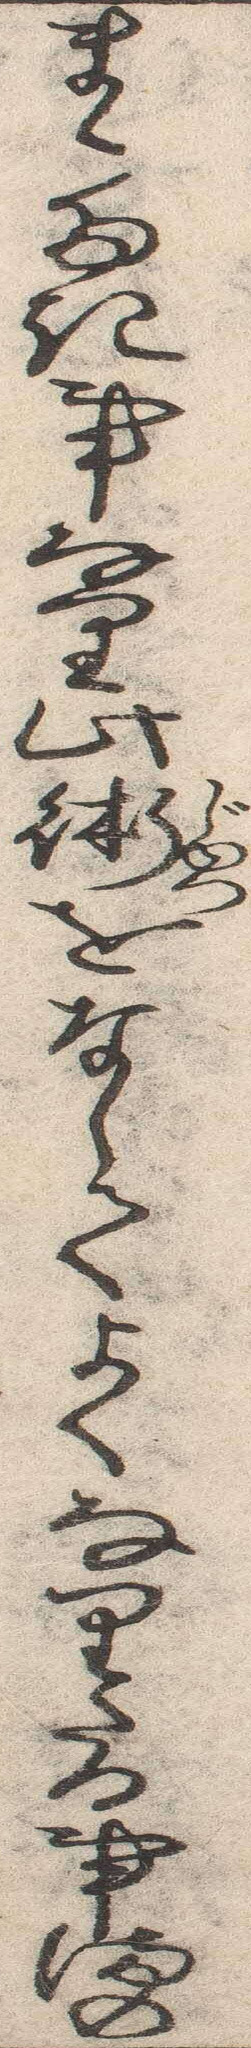まゝ多き事なり此術をなしてよくなりたる事まの
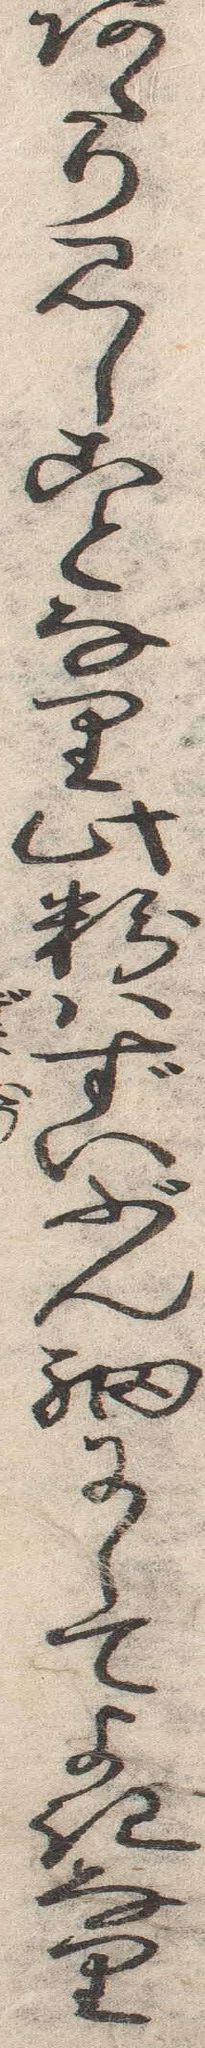あたり見しことなり此粉はずいぶん細にしてよきなり
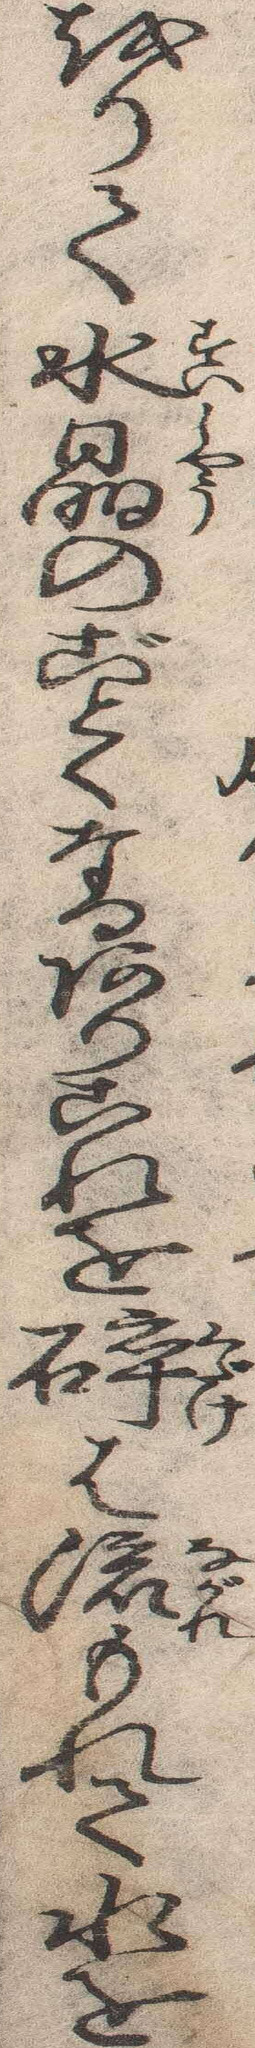をりて水晶のごとくなるありこれを砕は流もれて水を

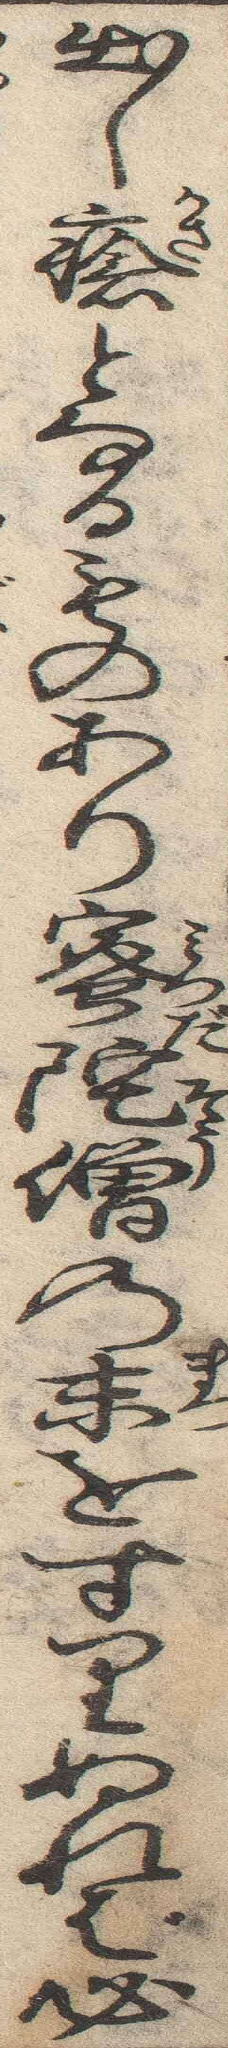出し瘡となるものあり蜜陀僧の末をすりぬれば必
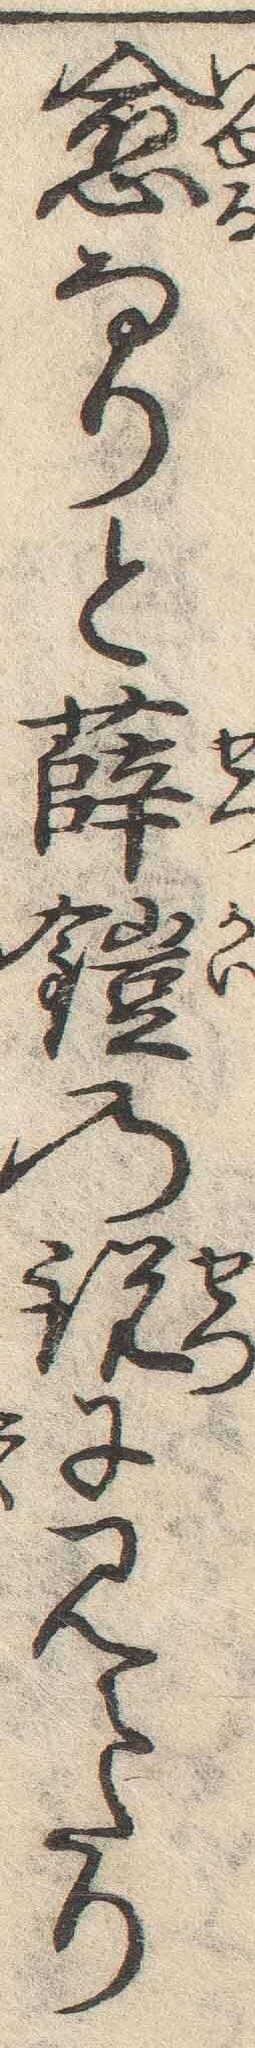愈なりと薛鎧の説に見えたり
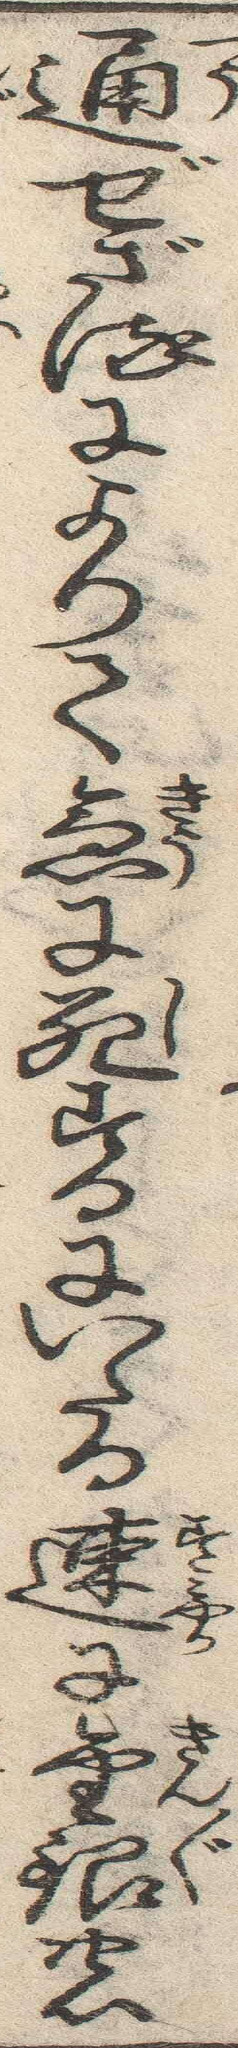通ぜざるによりて急に死するにいたる速に金銀の
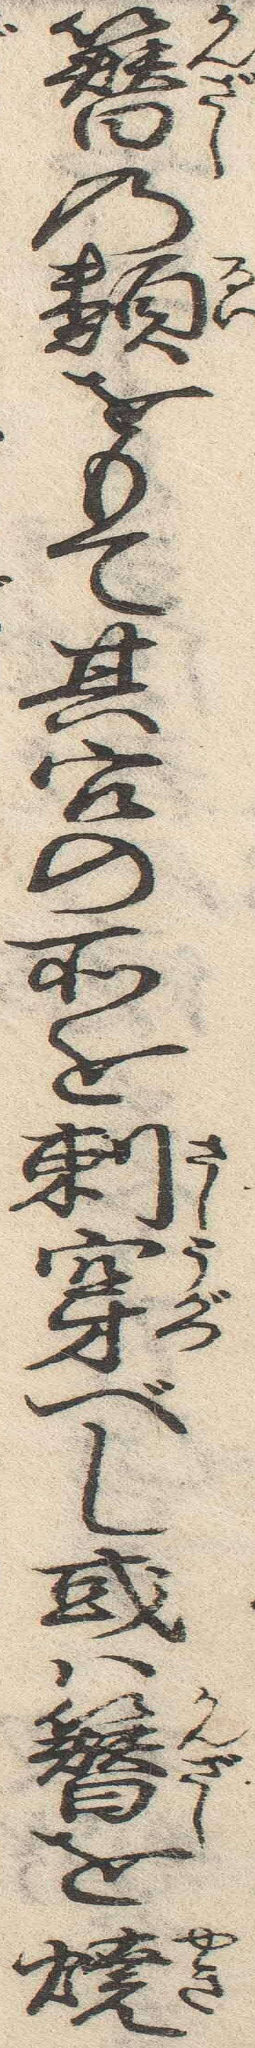簪の類をもて其穴の所を刺穿べし或は簪を焼
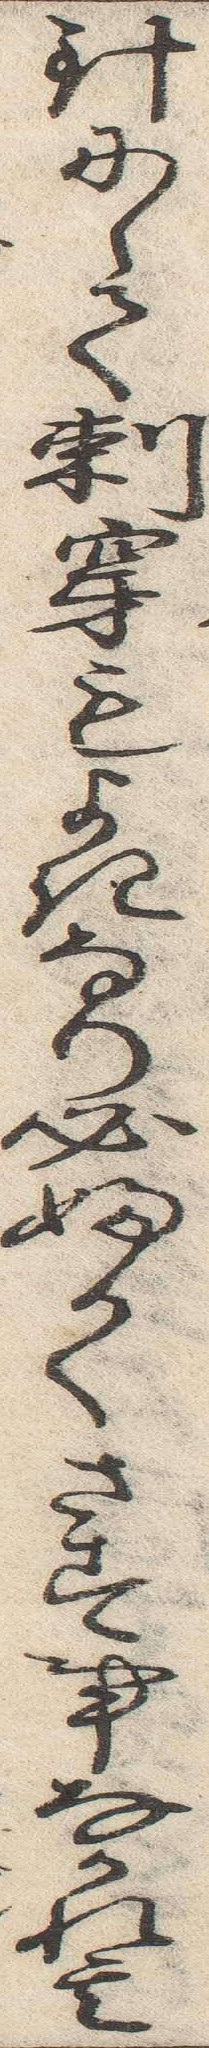針にして刺穿もよきなり必ふかくさす事なかれ其
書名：小児必用養育草
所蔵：東京学芸大学附属図書館 国文学研究資料館
